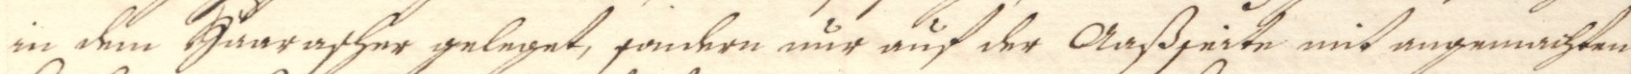in dem Haarascher geleget, sondern nur auf der Aaßseite mit angemachten
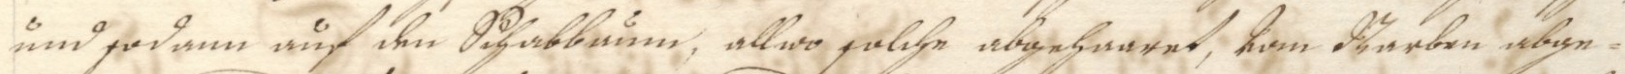und sodann auf den Schabbaum, allwo solche abgehaaret, vom Narben abge-
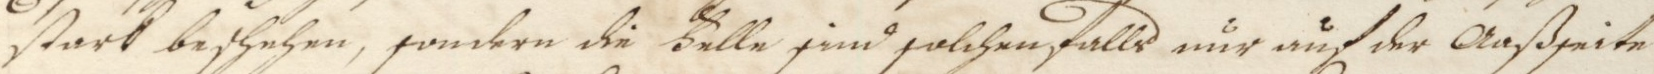stark beschehen, sondern die Felle sind solchenfalls nur auf der Aaßseite
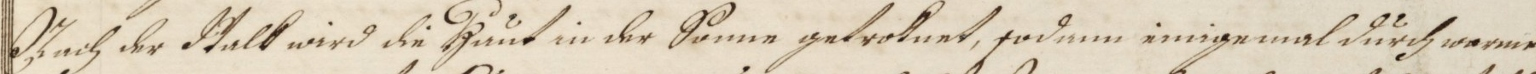Nach der Walk wird die Haut in der Sonne getroknet, sodann einigemal durch warme
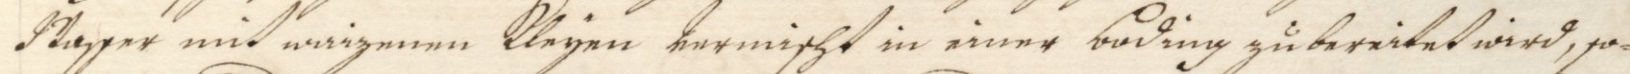Wasser mit waizenen Kleyen vermischt in einer Boding zubereitet wird, so-
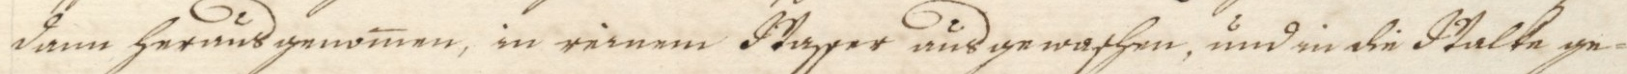dann herausgenommen, in reinem Wasser ausgewaschen, und in die Walke ge-
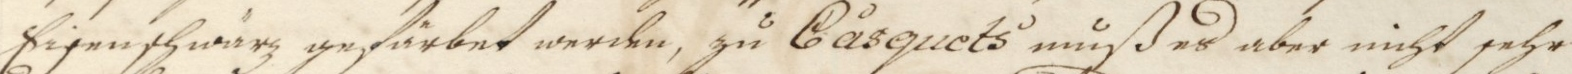Eisenschwärz gefärbet werden, zu Casquets muß es aber nicht sehr
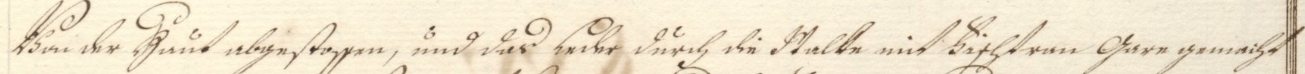Von der Haut abgestossen, und das Leder durch die Walke mit Fischtran Gare gemacht
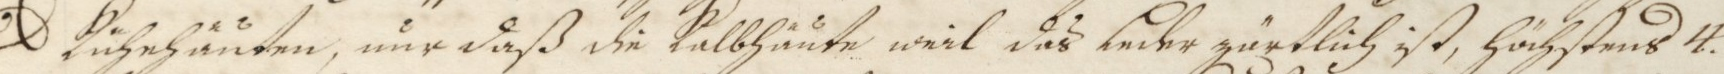Kühehäuten, nur daß die Kalbhäute weil das Leder zärtlich ist, höchstens 4.
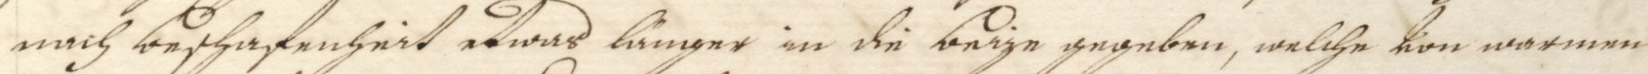nach Beschafenheit etwas länger in die Beize gegeben, welche von warmen
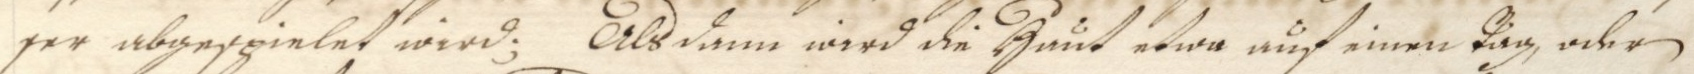ser abgespielet wird; Als dann wird die Haut etwa auf einen Tag, oder
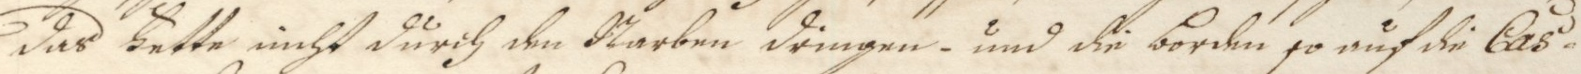das Fette nicht durch den Narben dringen - und die Borden so auf die Cas-
